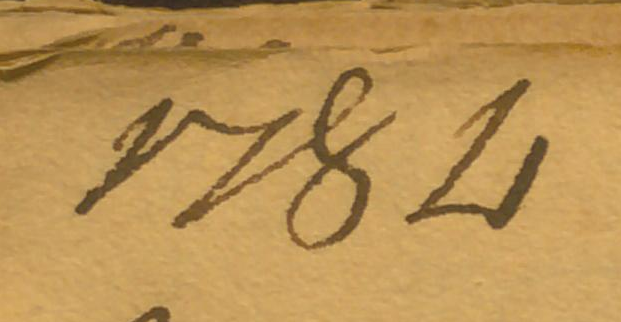1784
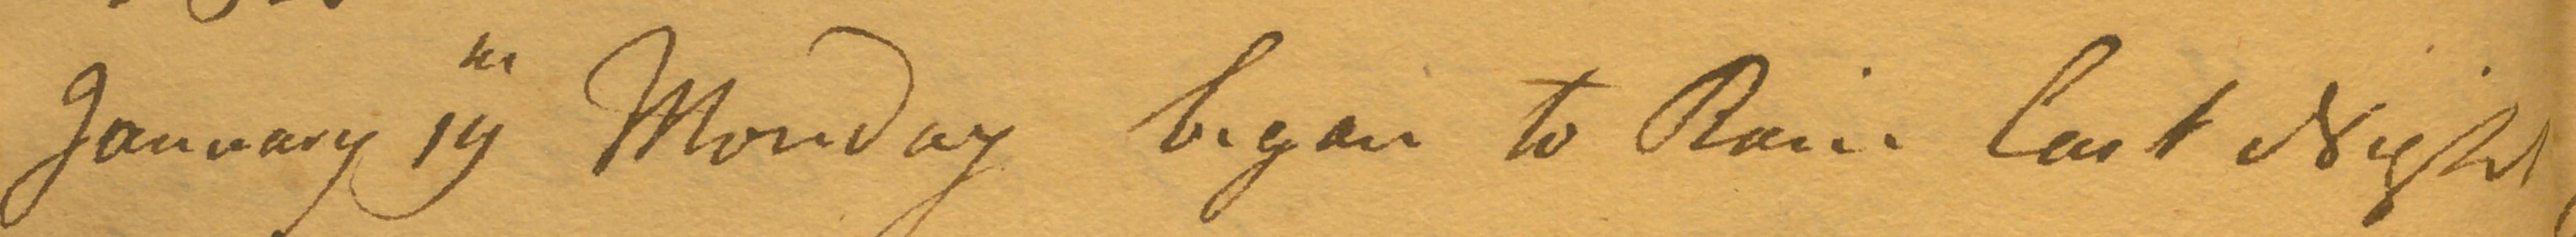January 19^th Monday began to Rain last Nigh
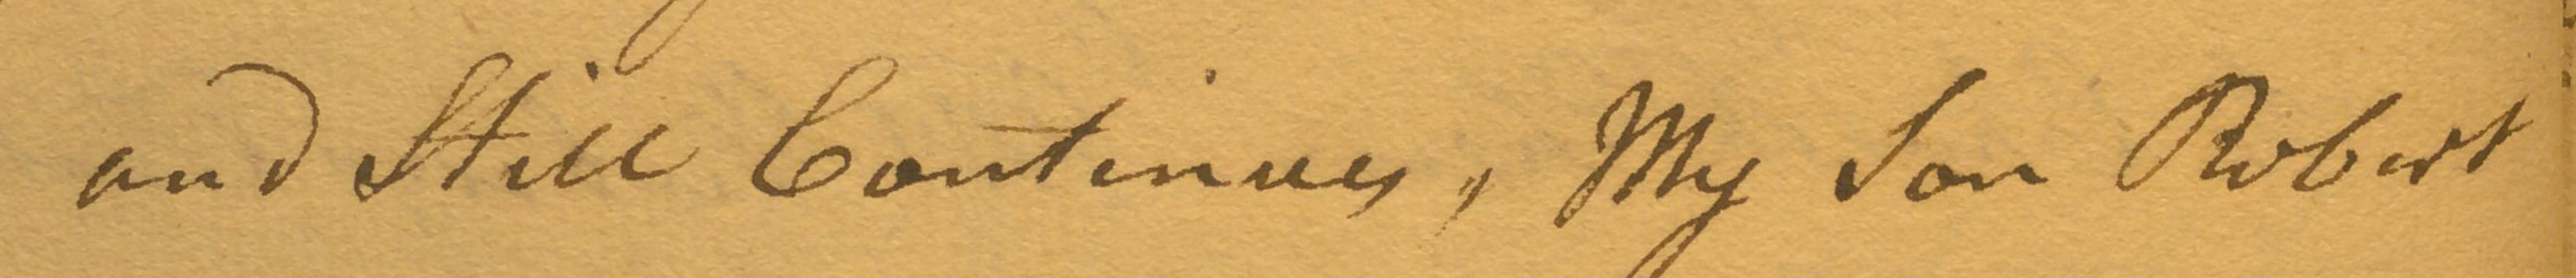and Still Continues, My Son Robert
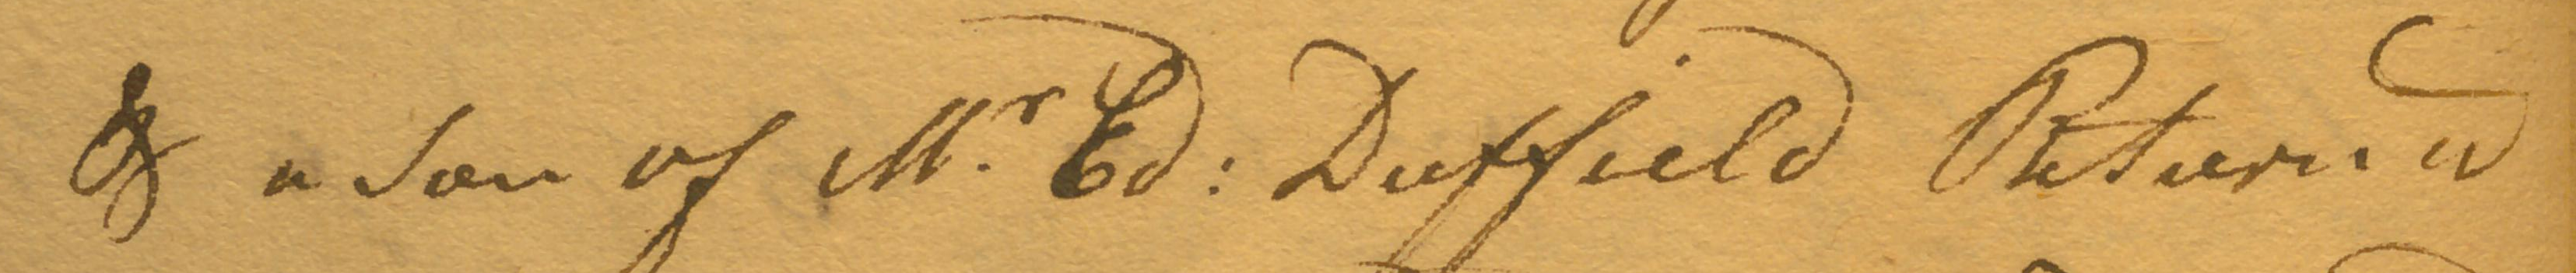& a Son of M^r. Ed: Duffield Returned
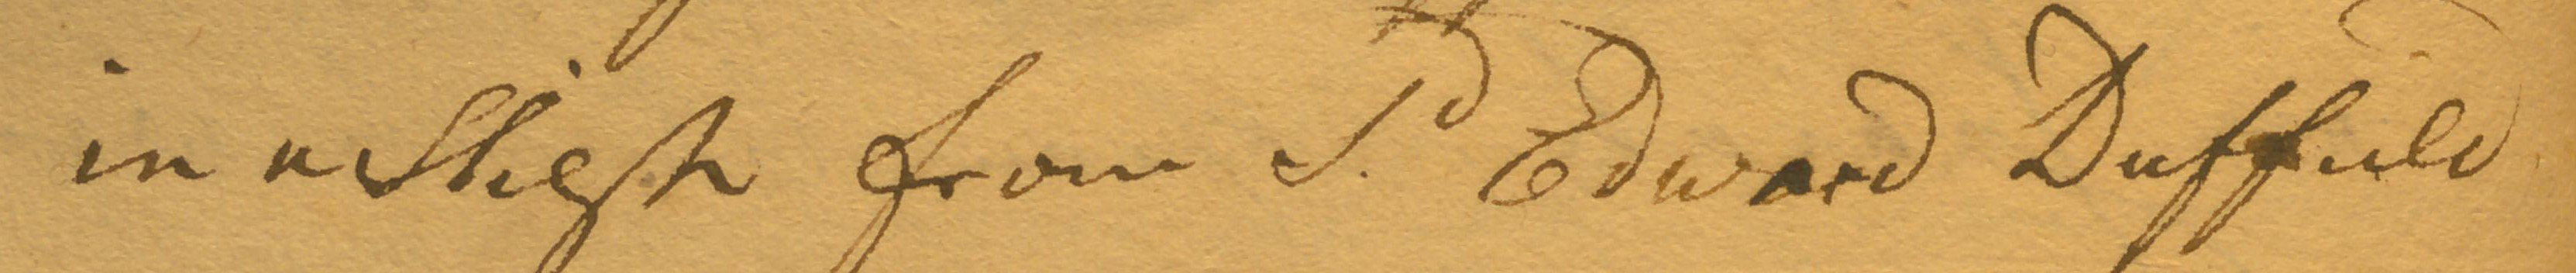in a Sligh from s^d. Edward Duffield
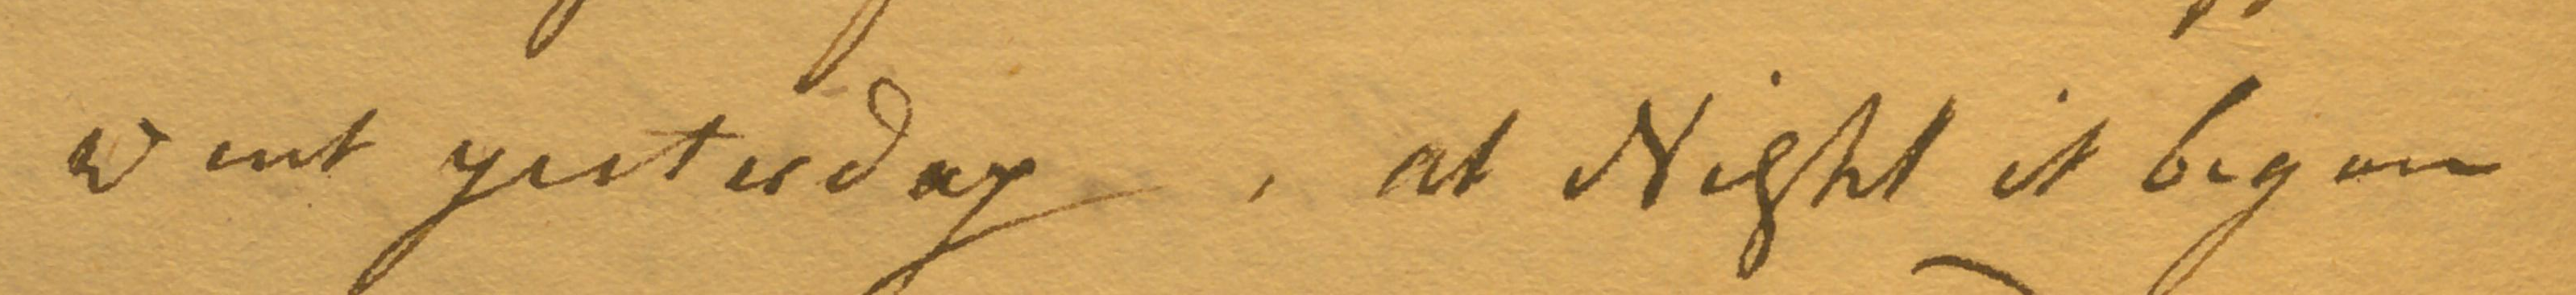went yesterday, at Night it began
